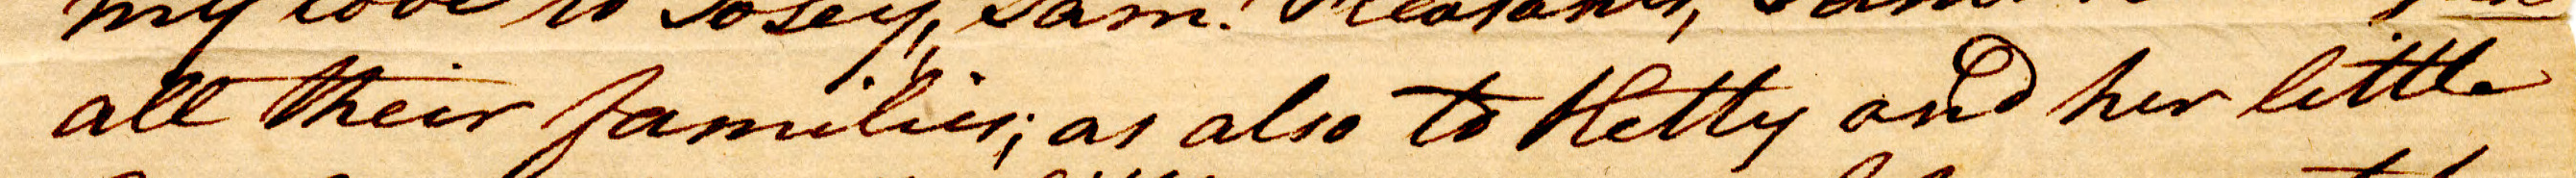all their families; as also to Hetty and her little
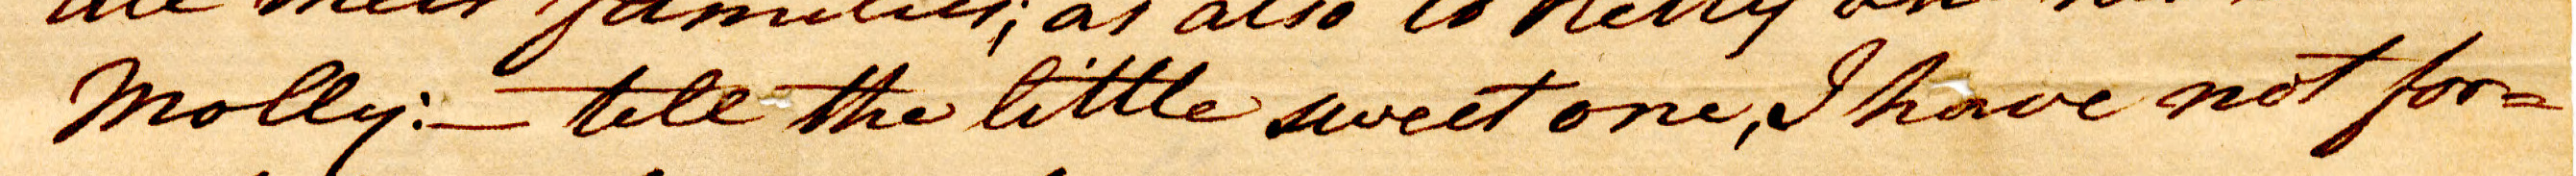Molly:- tell the little sweet one, I have not for-
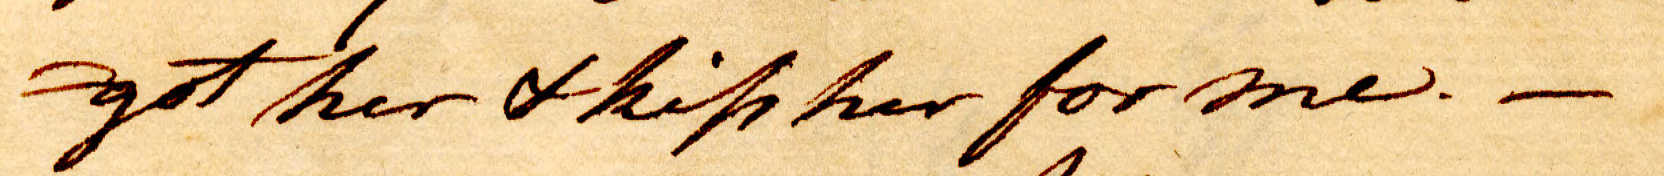-got her & kiss her for me.-
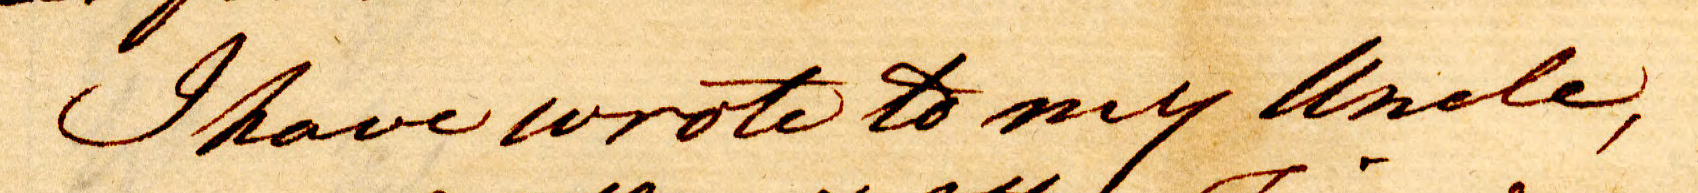I have wrote to my Uncle,
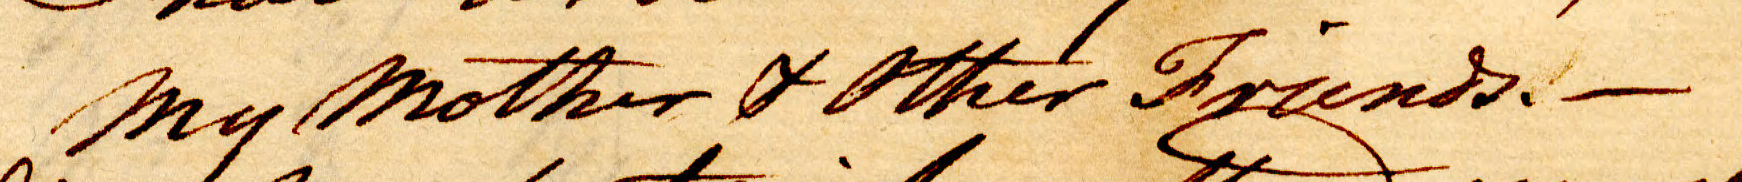My Mother & Other Friends.-
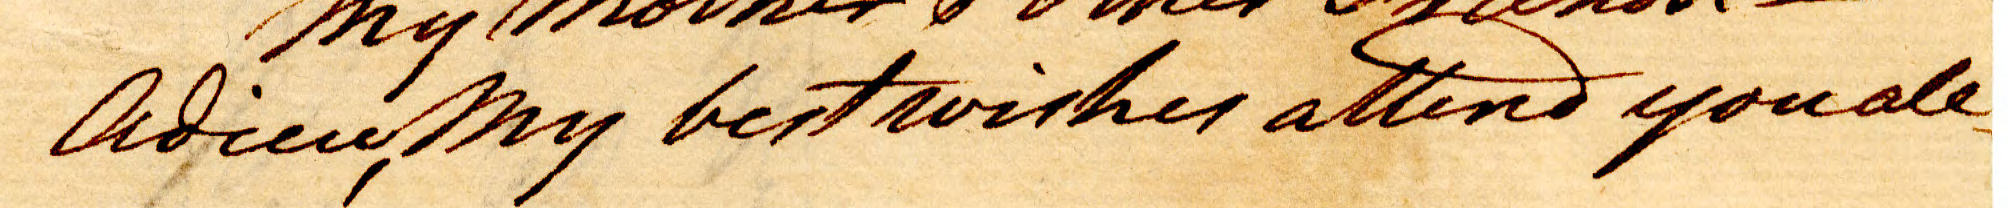Adieu, My best wishes attend you all
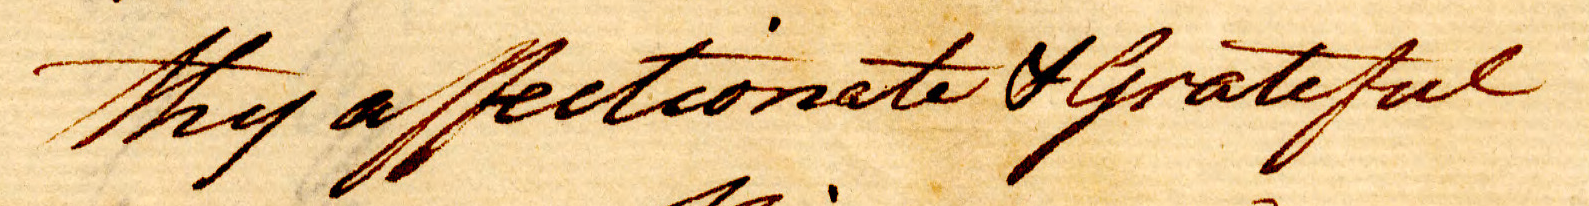thy affectionate & Grateful
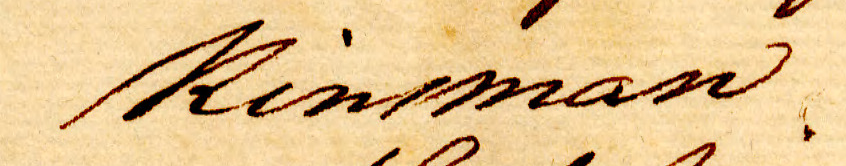Kinsman
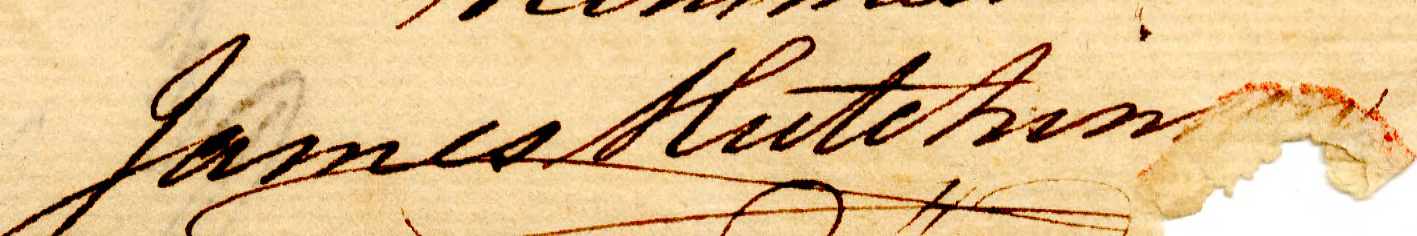James Hutchin[_]
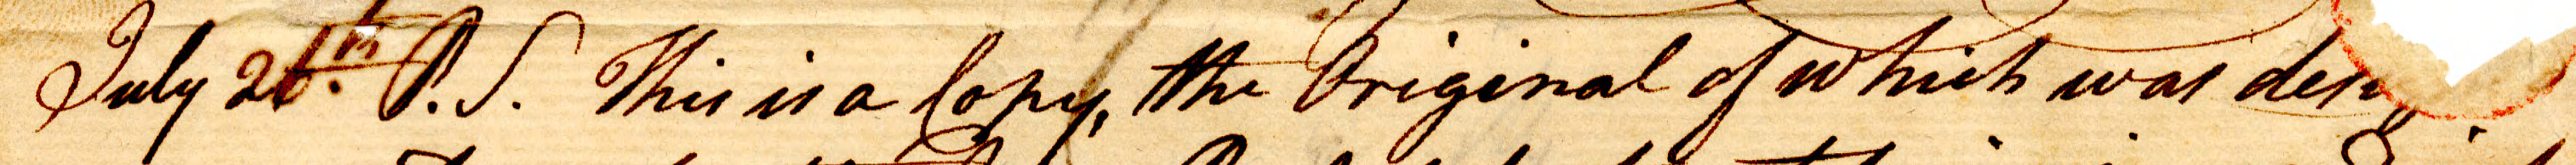July 26^th. P.S. This is a Copy, the Original of which was des[_]
